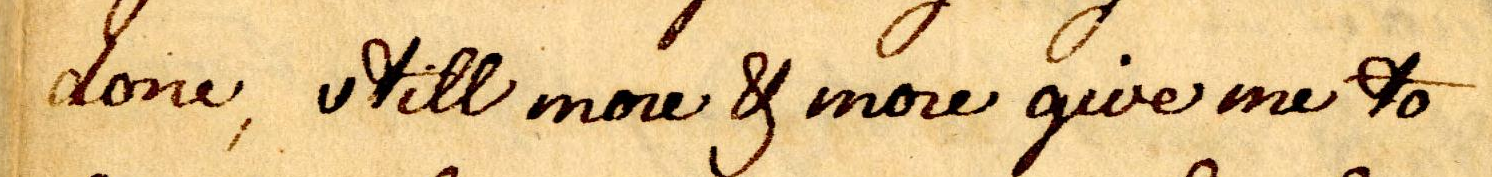done, still more & more give me to
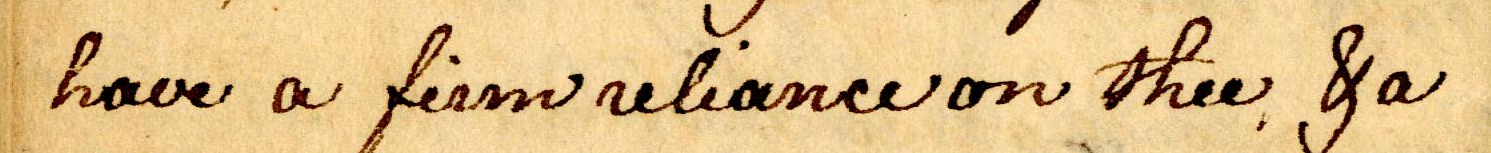have a firm reliance on thee, & a
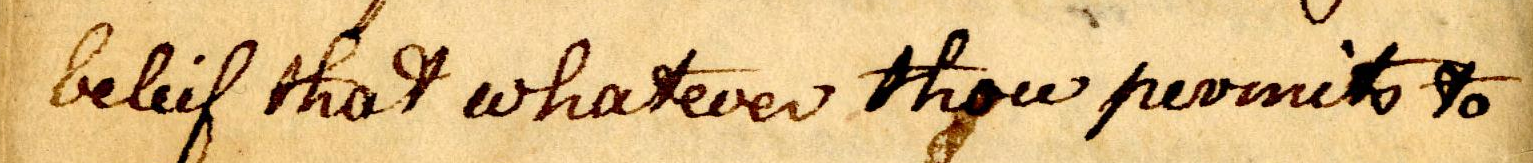beleif that whatever thou permits to
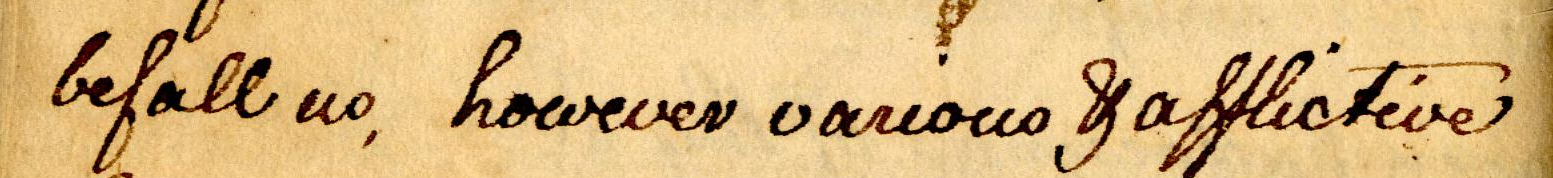befall us, however various & afflictive
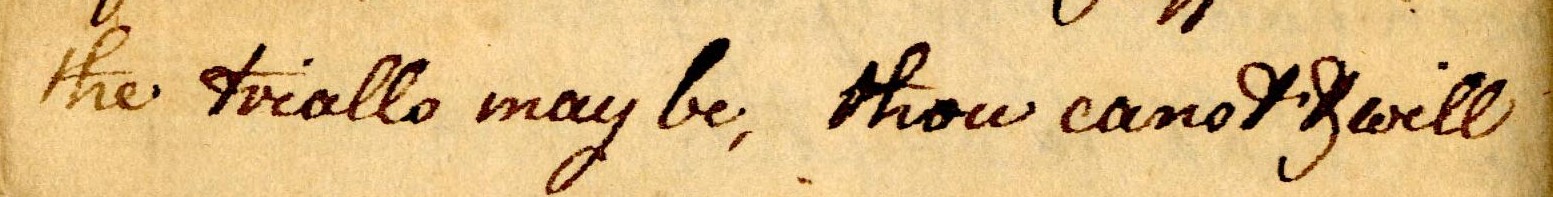the trialls may be, thou canst & will
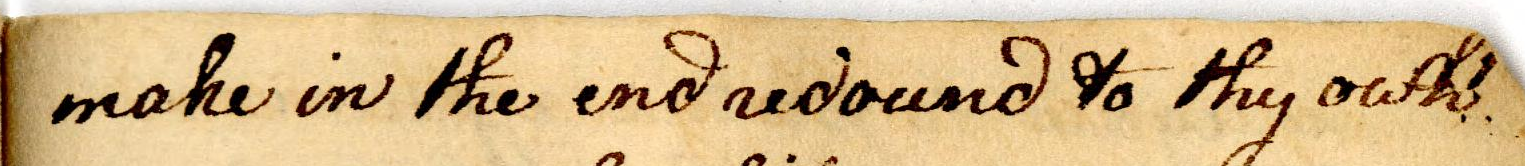make in the and redound to thy own
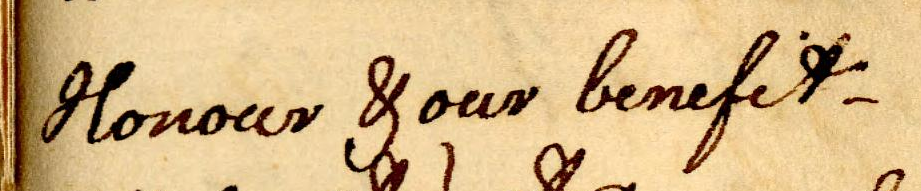Honour & our benefit-
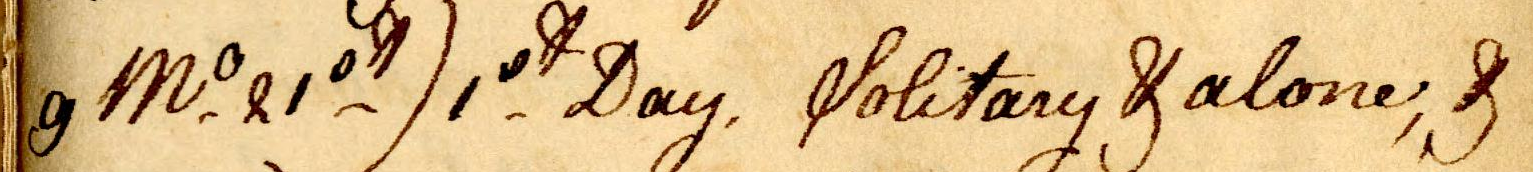9 M^o 21^st ) 1^st Day, Solitary & alone, &
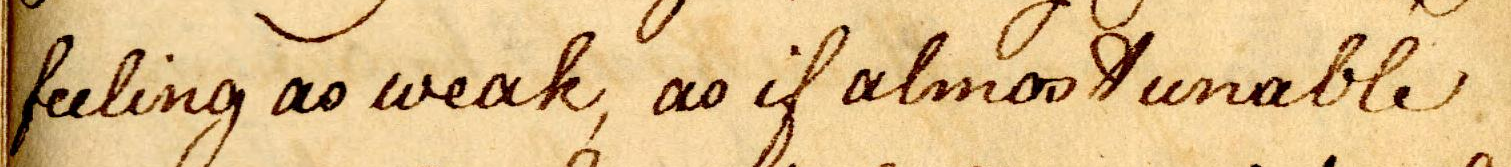feeling as weak, as if almost unable
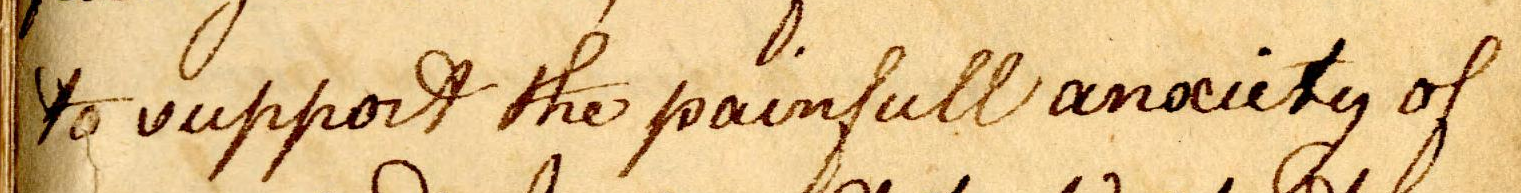to support the painfull anxiety of
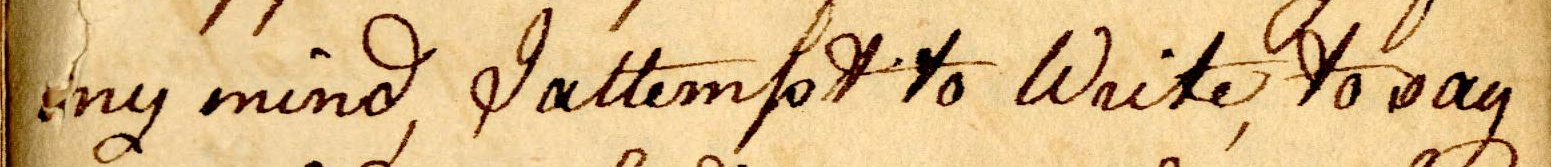my mind I attempt to Write, to say
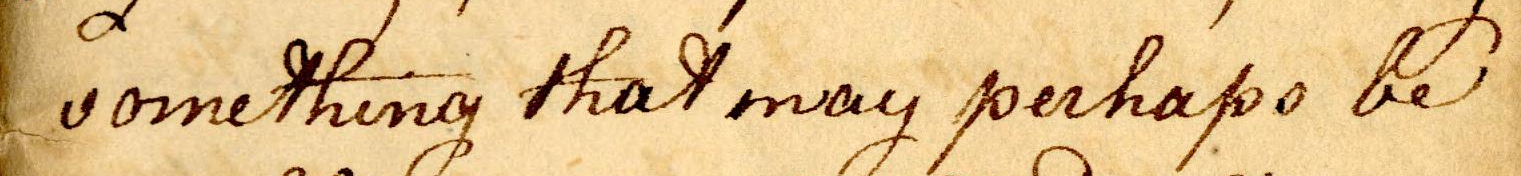something that may perhaps be
